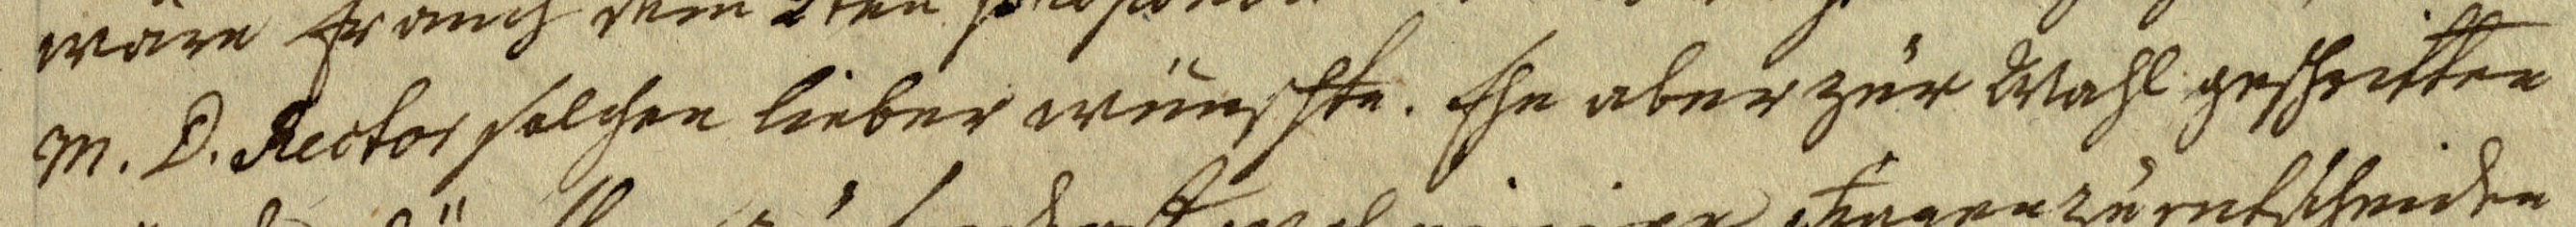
M. D. Rector solchen lieber wünschte. Ehe aber zur Wahl geschritten
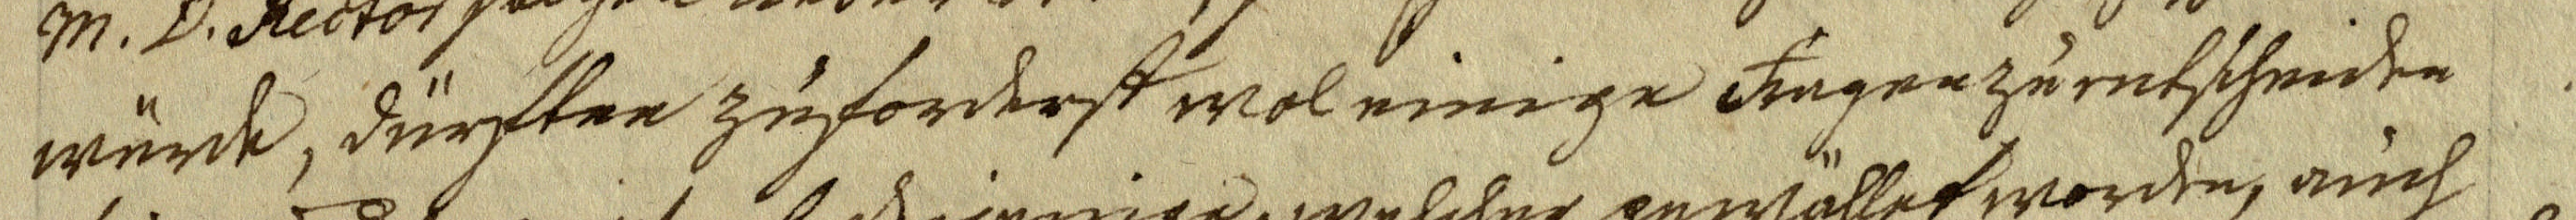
würde, dürften zuforderst wol einige Fragen zu entscheiden
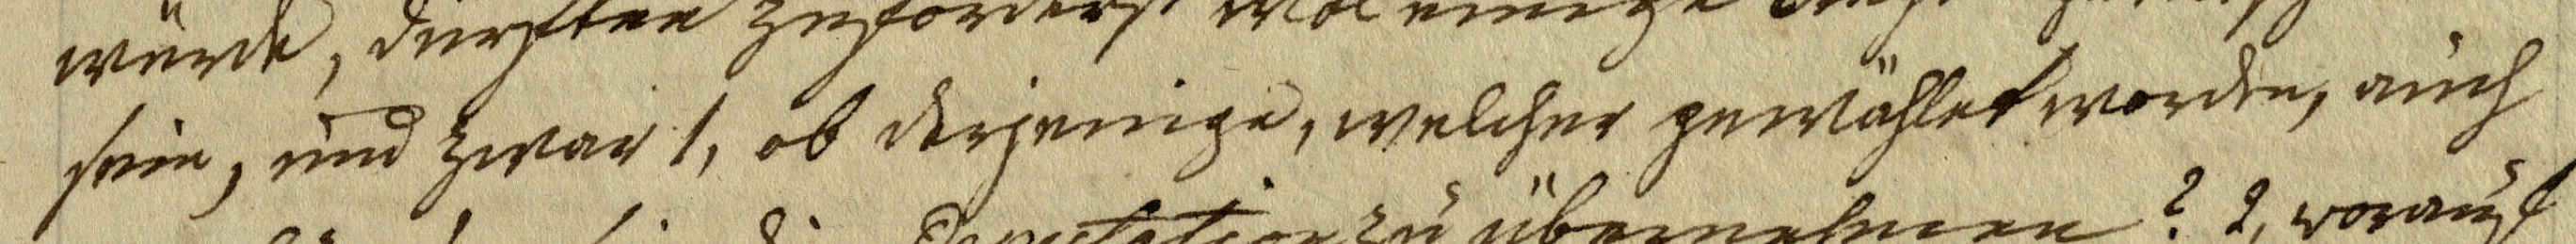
sein, und zwar 1, ob derjenige welcher gewählet worden, auch
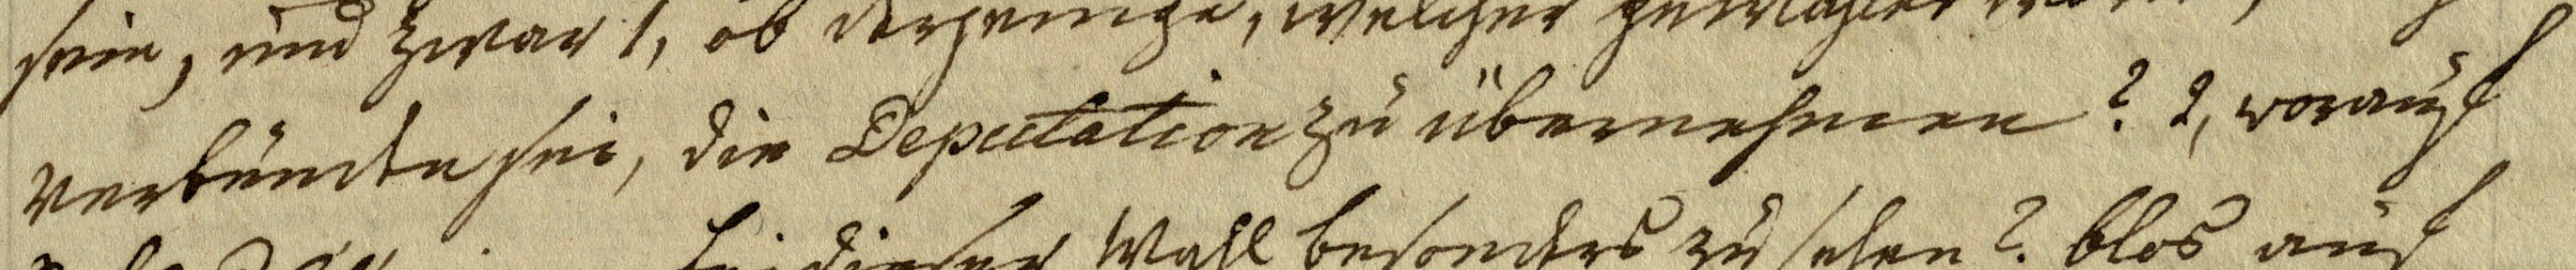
verbunden sei, die Deputation zu übernehmen? 2, worauf
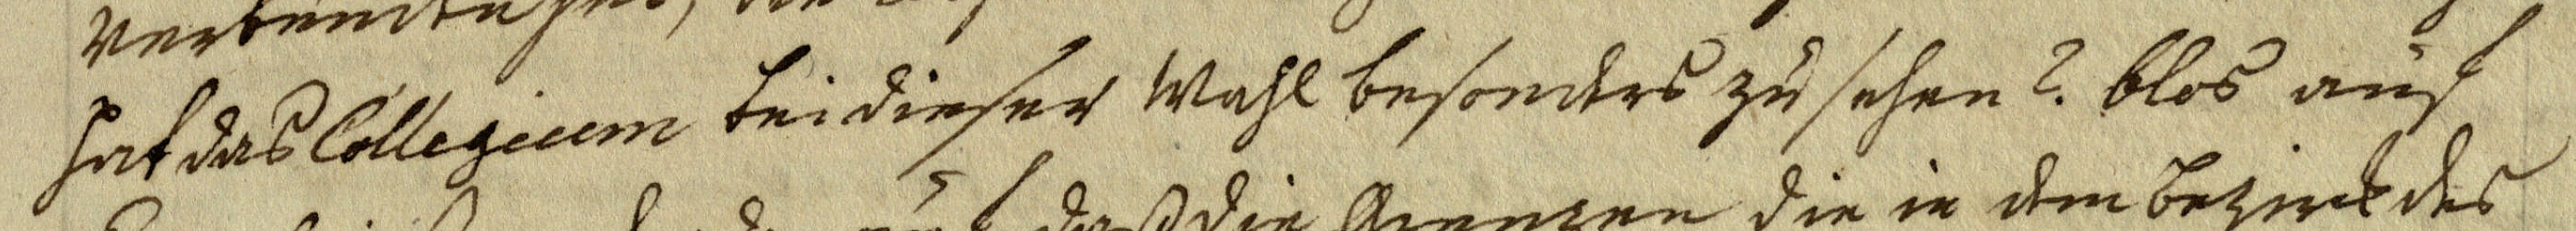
hat das Collegium bei dieser Wahl besonders zu sehen? blos auf
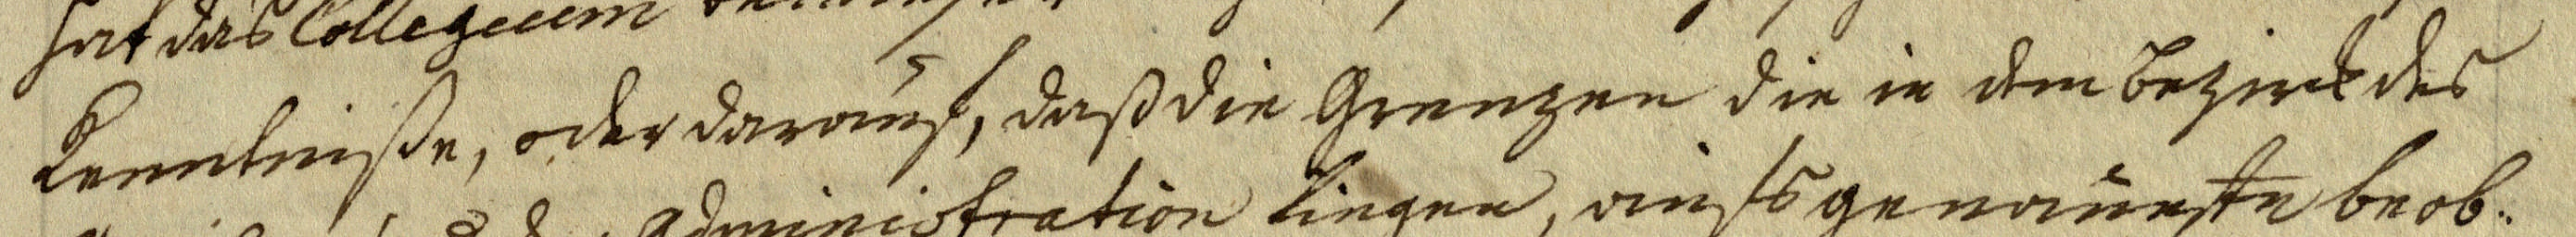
Kenntniße, oder darauf, daß die Grenzen die in dem Bezirk des
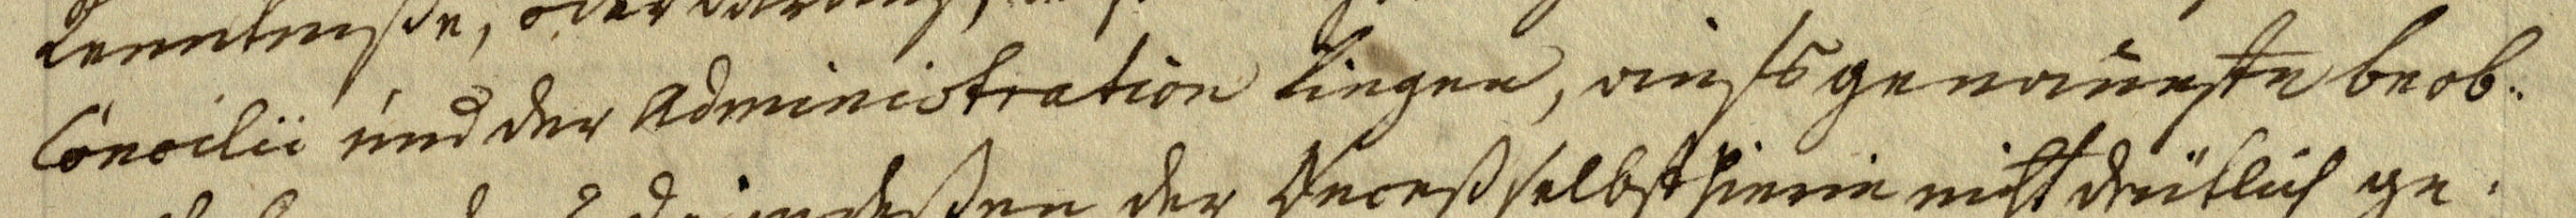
Concilii und der Administration liegen, aufs genaueste beob¬
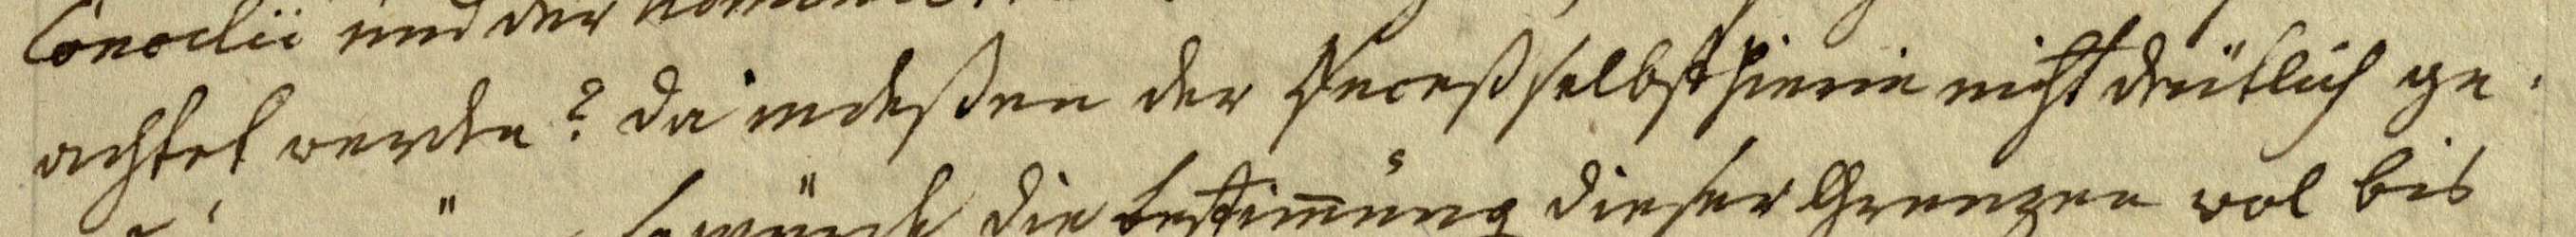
achtet werden? Da indeßen der Recess selbst hierin nicht deutlich ge¬
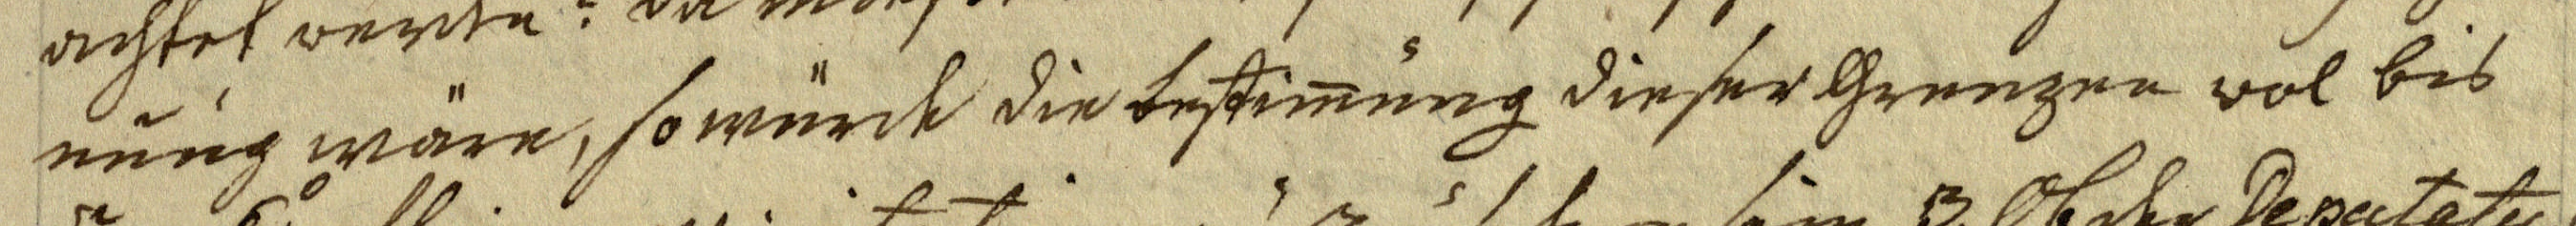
nung wäre, so würde die Bestimung dieser Grenzen wol bis
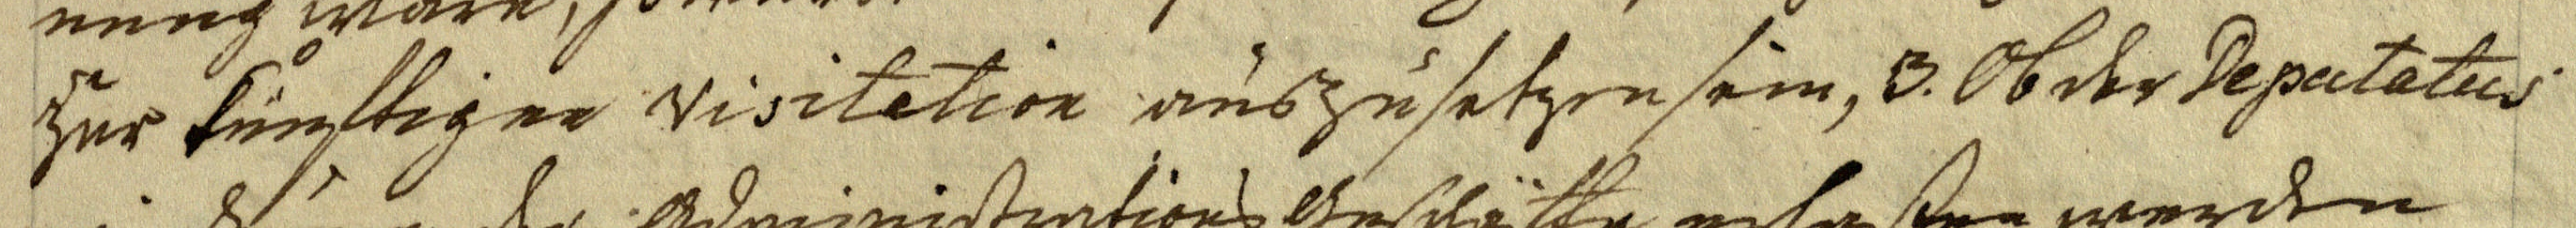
zur künftigen visitation auszusetzen sein, 3. ob der Deputatus
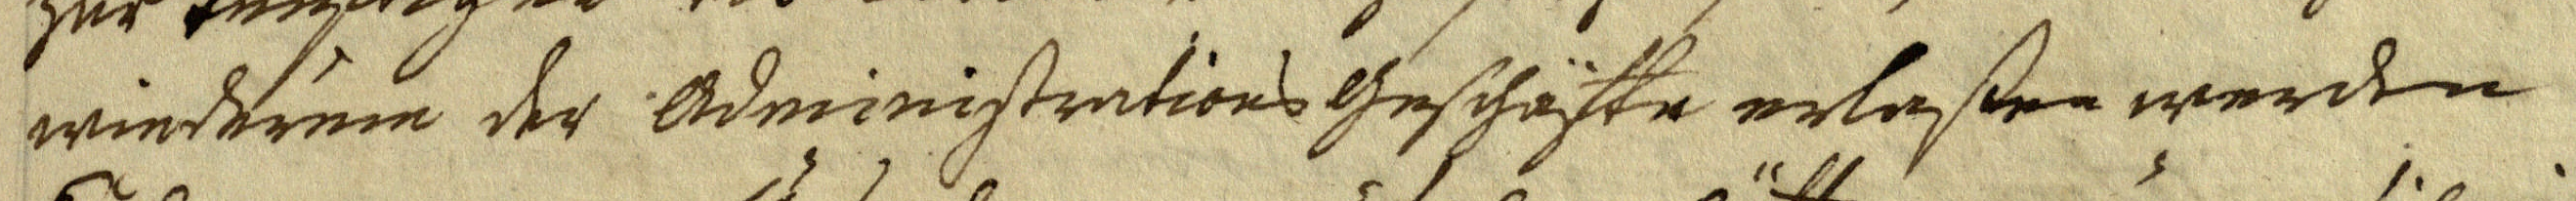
wiederum der Administrations Geschäfte erlaßen werden
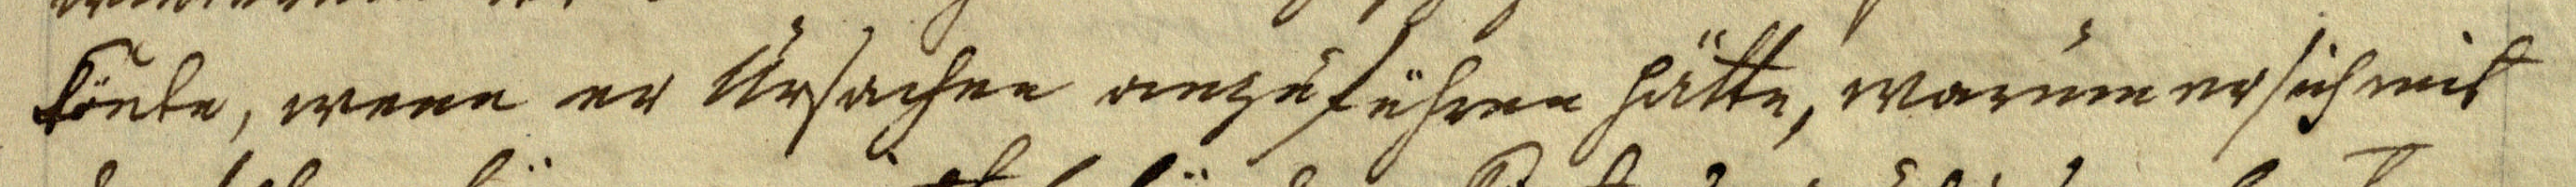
könte, wenn Er Ursachen anzuführen hätte, warum er sich mit
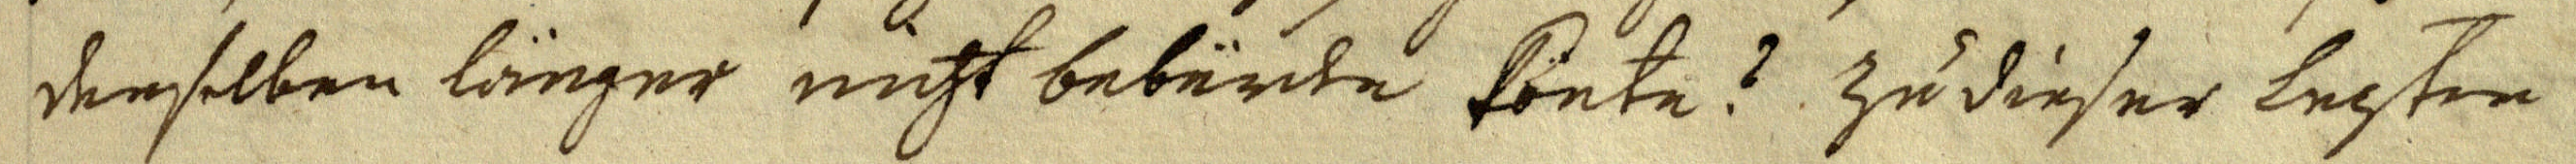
denselben länger nicht bebürden könte? Zu dieser lezten
